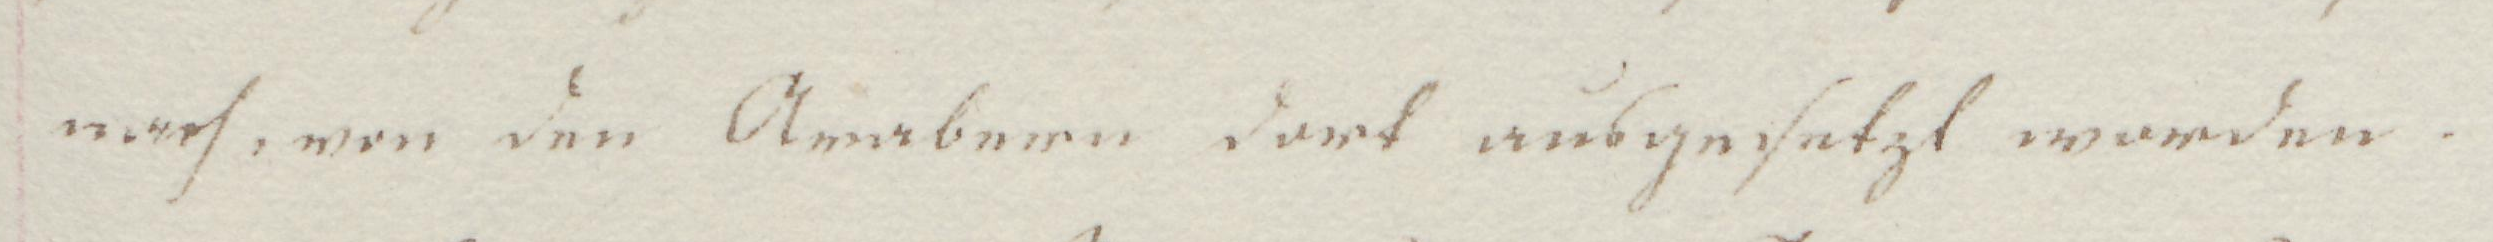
nach, von den Arabern dort ausgesetzt worden.
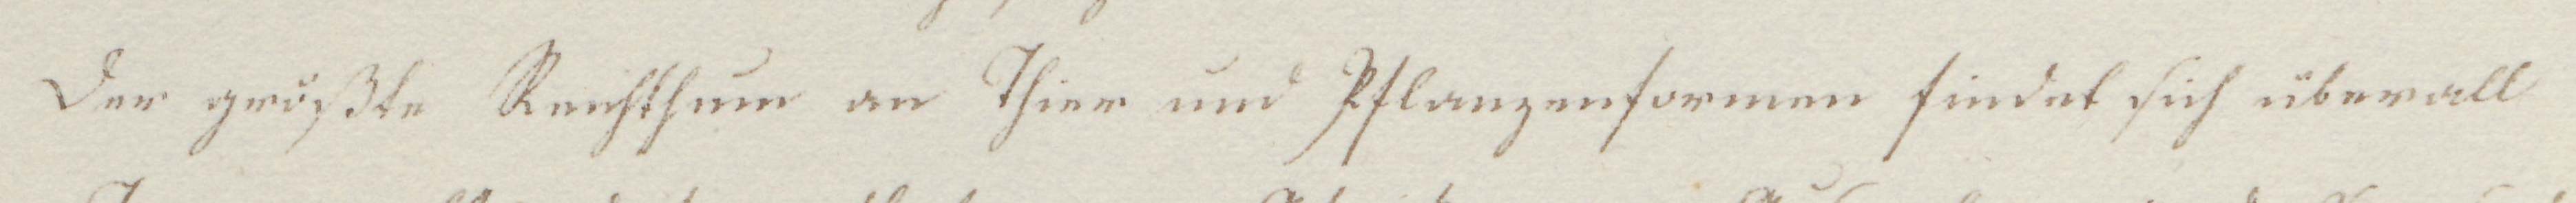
Der größte Reichthum an Thier und Pflanzenformen findet sich überall
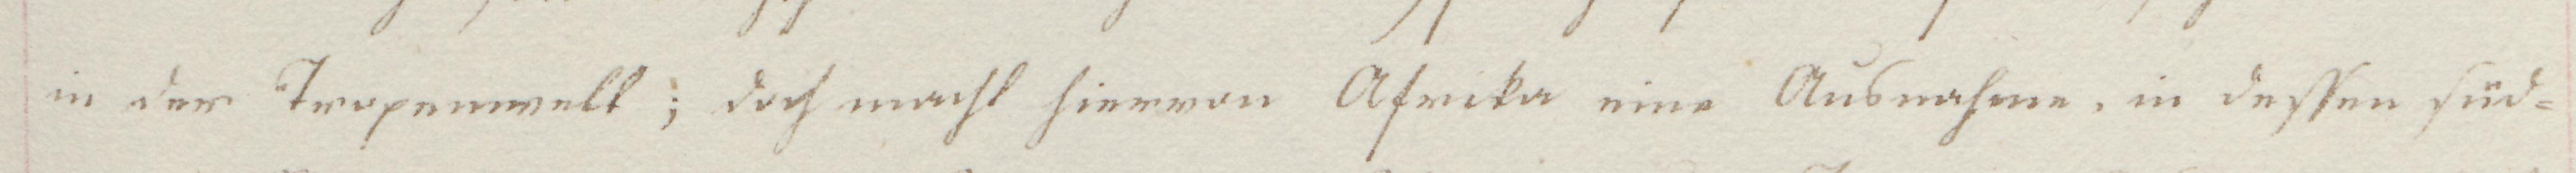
in der Tropenwelt; doch macht hiervon Afrika eine Ausnahme, in dessen süd-
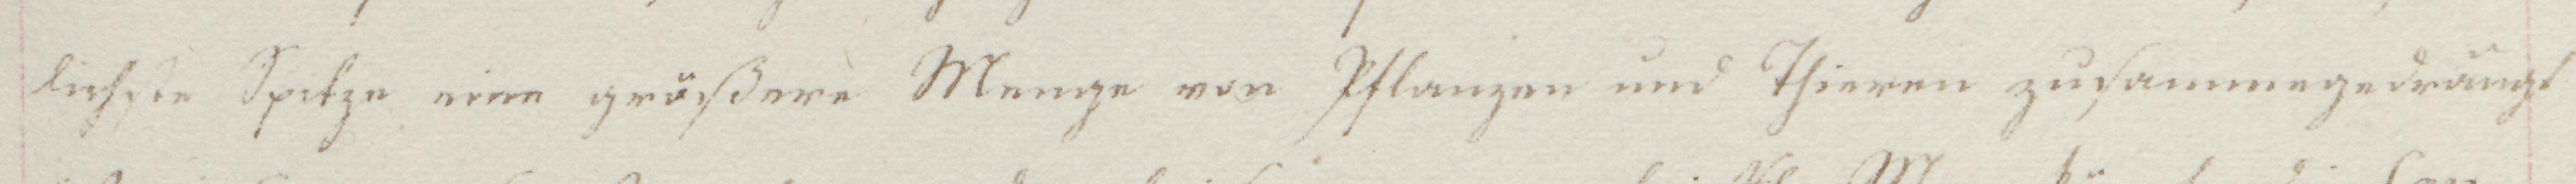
lichste Spitze eine größere Menge von Pflanzen und Thieren zusammengedrängt
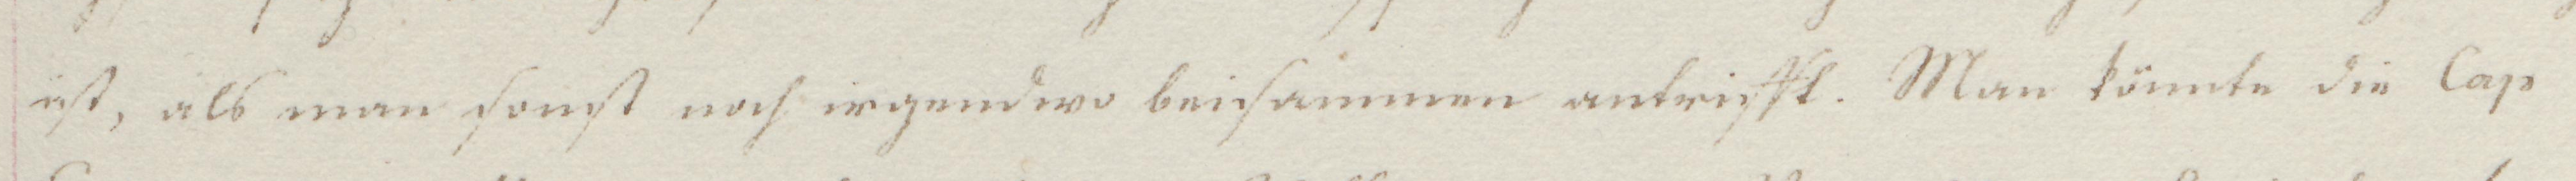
ist, als man sonst noch irgendwo beisammen antrifft. Man könnte die Cap
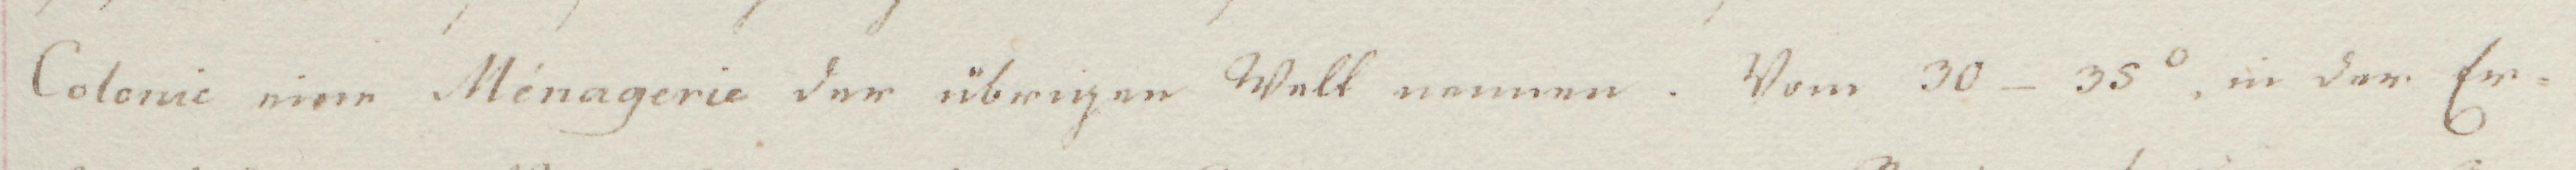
Colonie eine Ménagerie der übrigen Welt nennen. Vom 30–35°, in der Er-
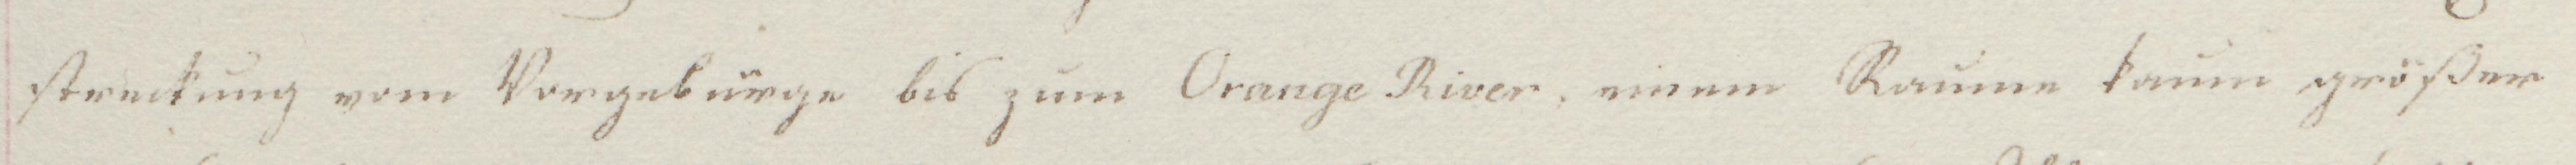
streckung vom Vorgebürge bis zum Orange River, einem Raum kaum größer
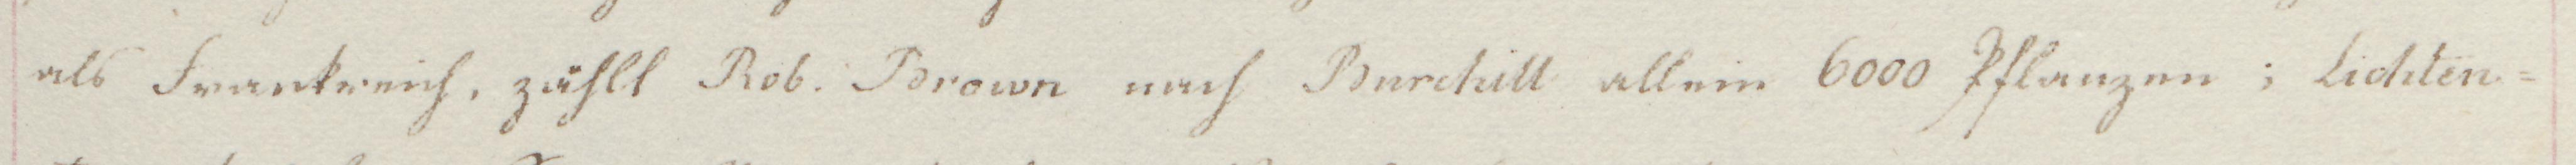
als Frankreich, zählt Rob. Brown nach Burchill allein 6000 Pflanzen; Lichten-
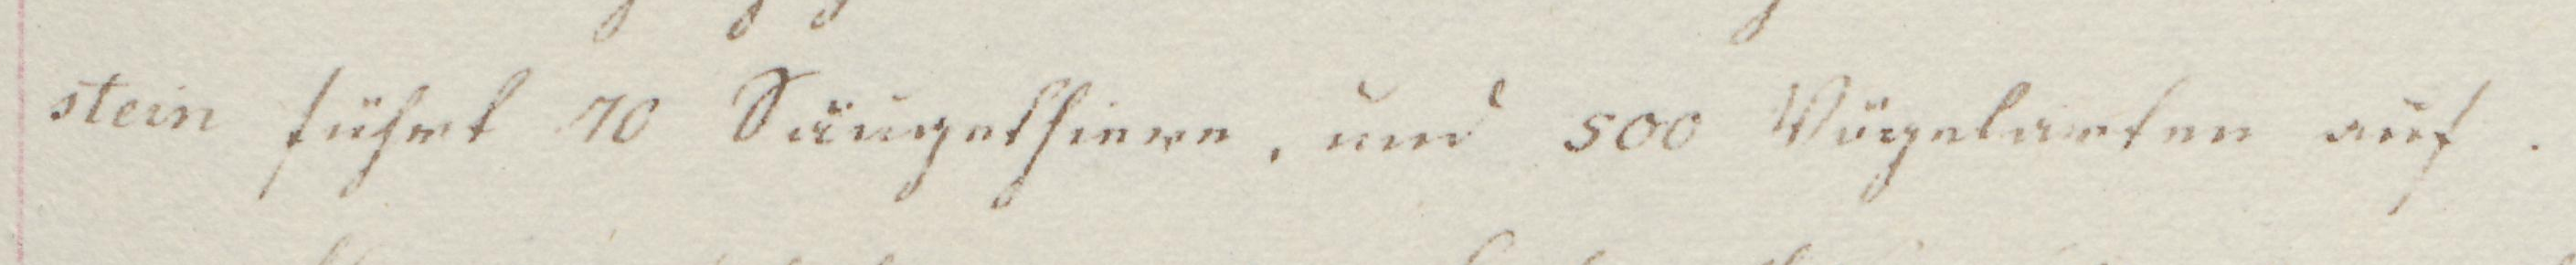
stein führt 70 Säugethiere, und 500 Vögelarten auf.
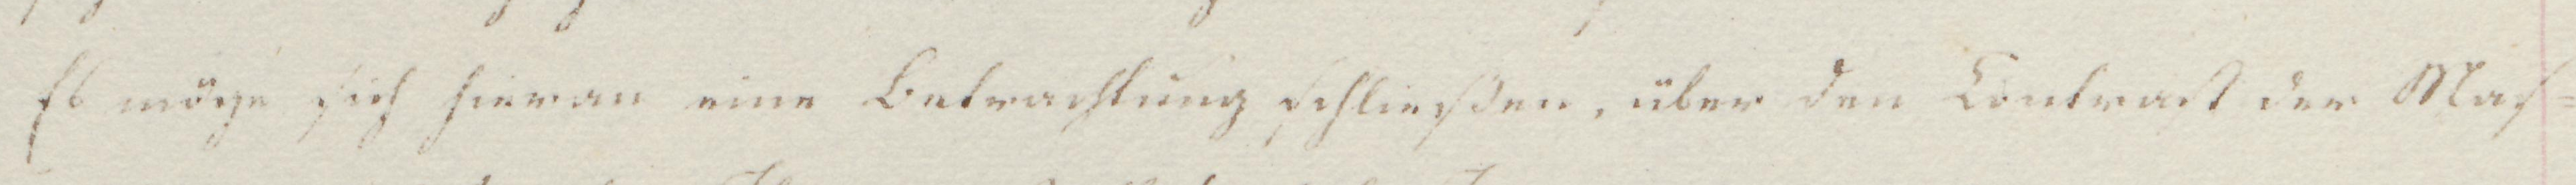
Es möge sich hieran eine Betrachtung schließen, über den Contrast der Mas-
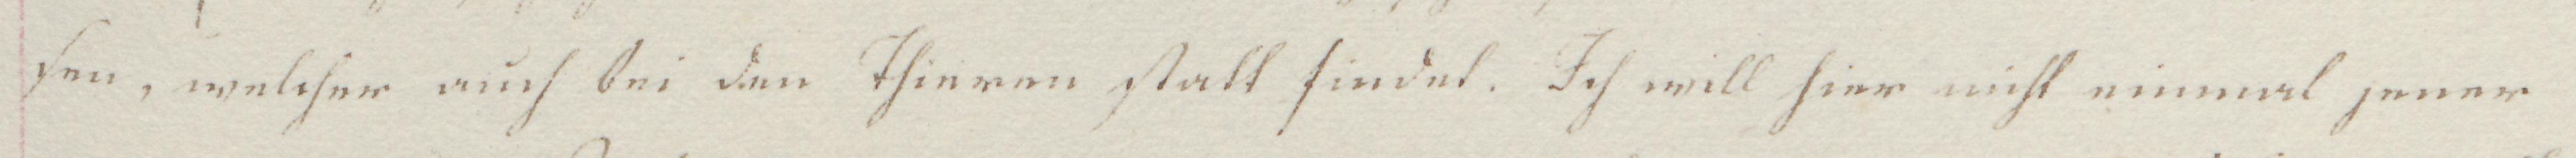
sen, welcher auch bei den Thieren statt findet. Ich will hier nicht einmal jener
